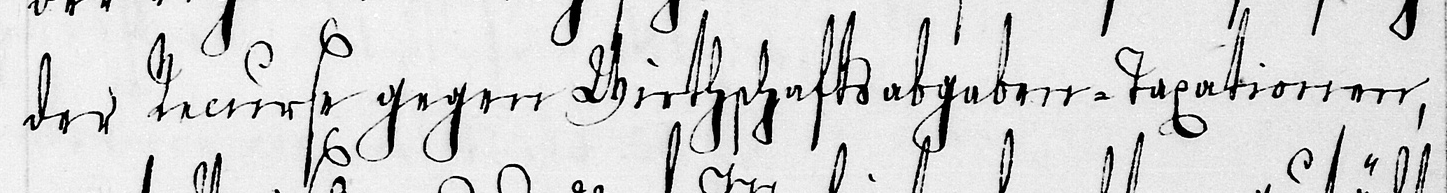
der Recurse gegen Wirthschaftsabgaben-Taxationen,
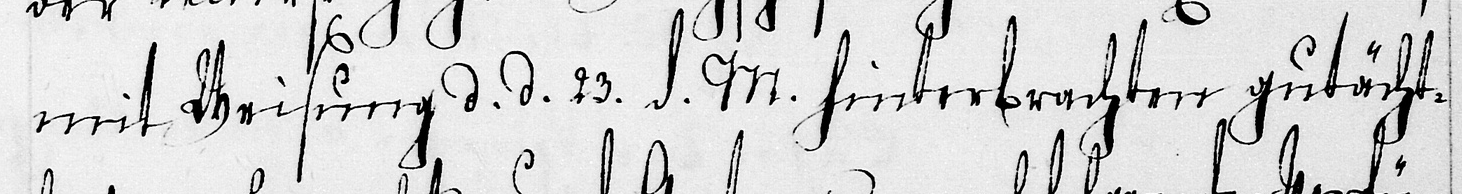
mit Weisung d. d. 23. d. M. hinterbrachten gutächt¬
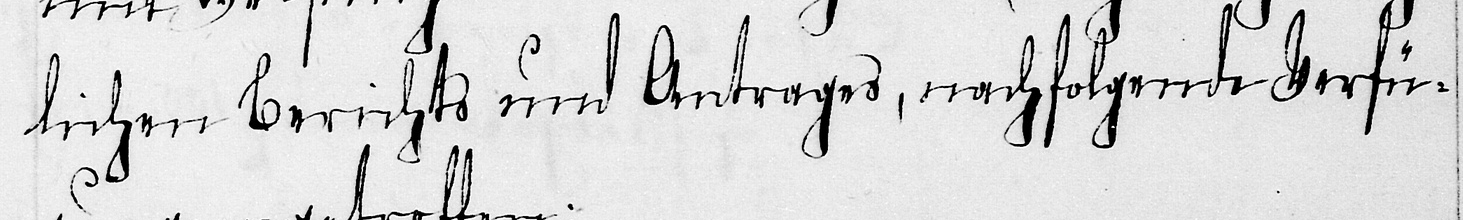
lichen Berichts und Antrages, nachfolgende Verfü¬
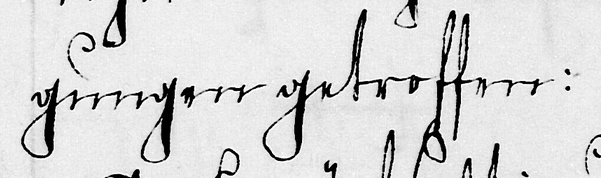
gungen getroffen:
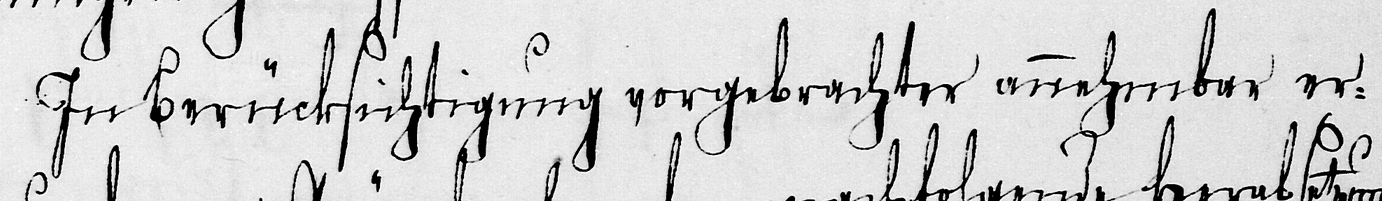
In Berücksichtigung vorgebrachter annehmbar er¬
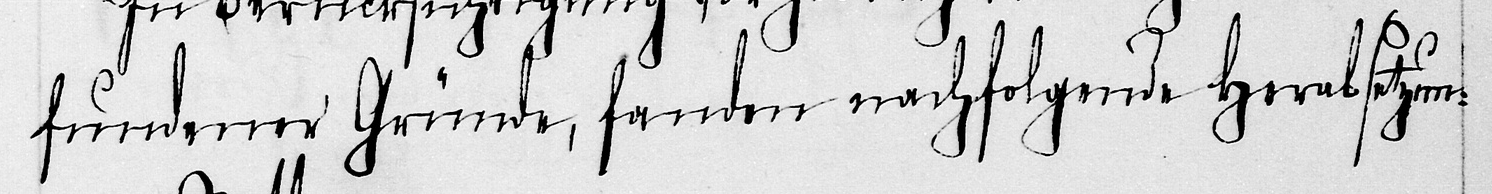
fundener Gründe, fanden nachfolgende Herabsetzun¬
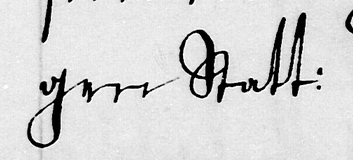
gen Statt:
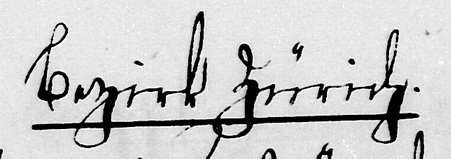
Bezirk Zürich.
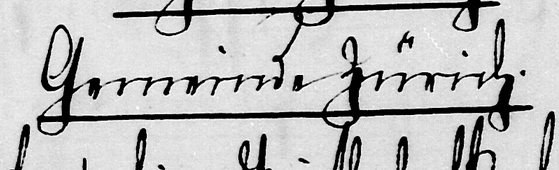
Gemeinde Zürich.
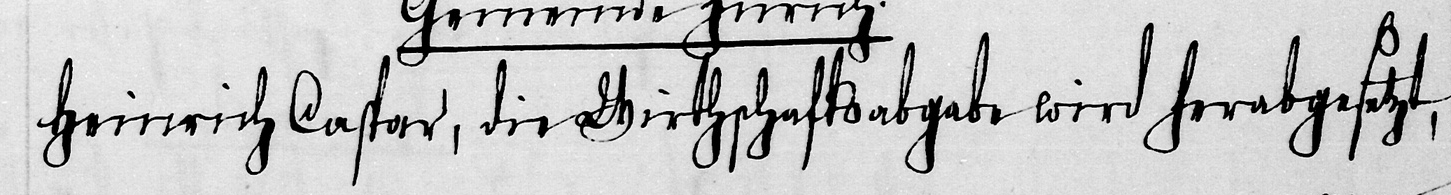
Heinrich Caspar, die Wirthschaftsabgabe wird herabgesetz¬
